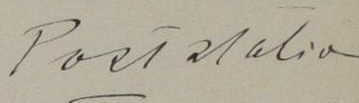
Poststation
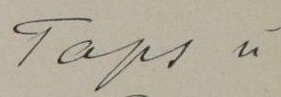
Taps u.
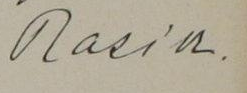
Rasik.
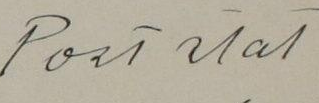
Post stat
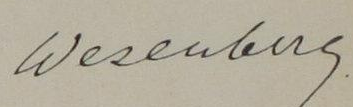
Wesenberg
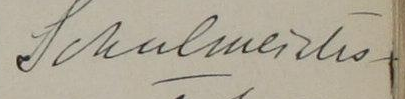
Schulmeister.
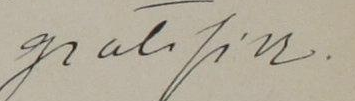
gratifik.
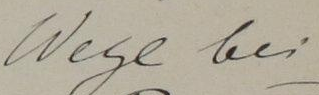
Wege bei
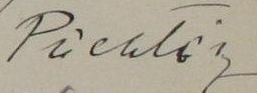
Püchtiz
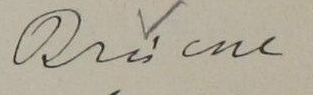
Brücke
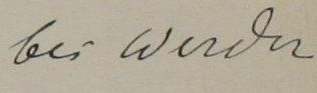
bei Werder
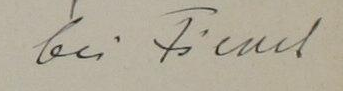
bei Fickel
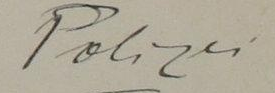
Polizei
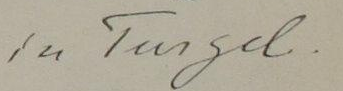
in Turgel.
